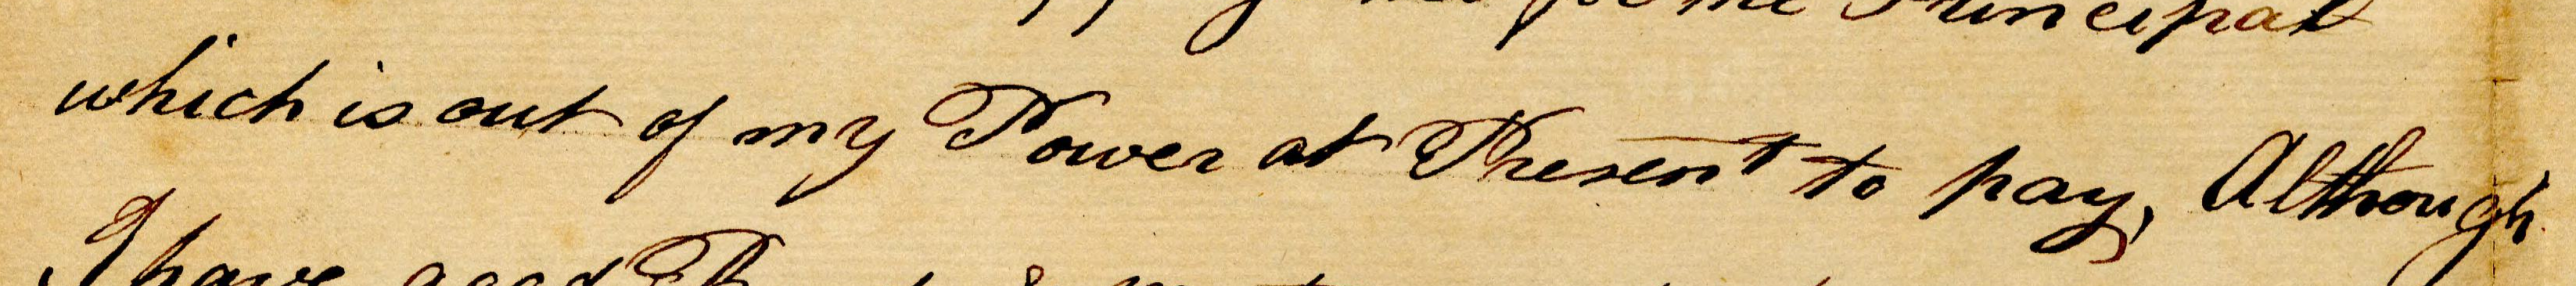which is out of my Power at Present to pay, Although
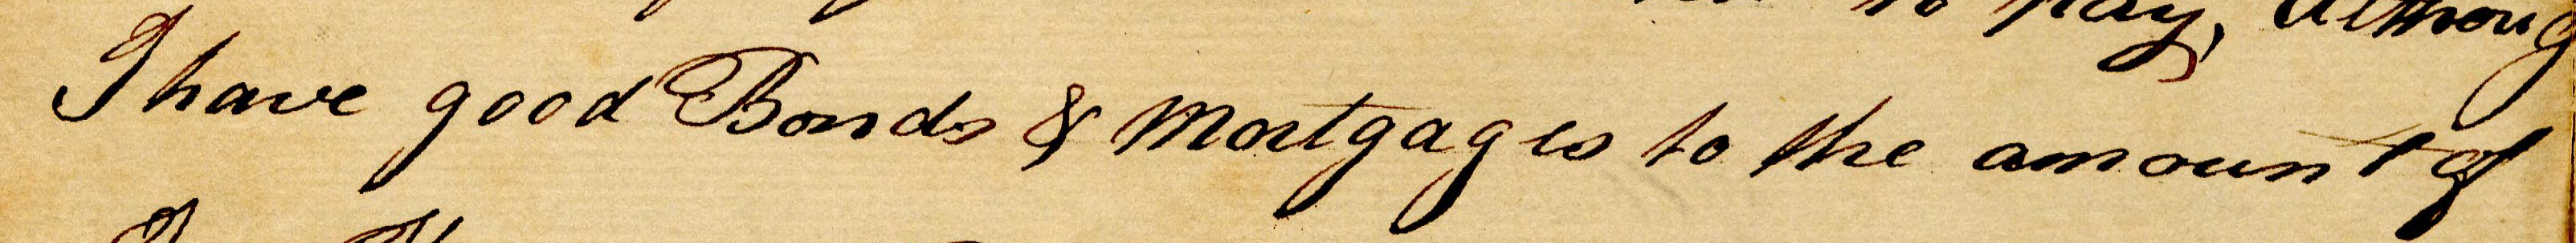I have good Bonds & mortgages to the amount of
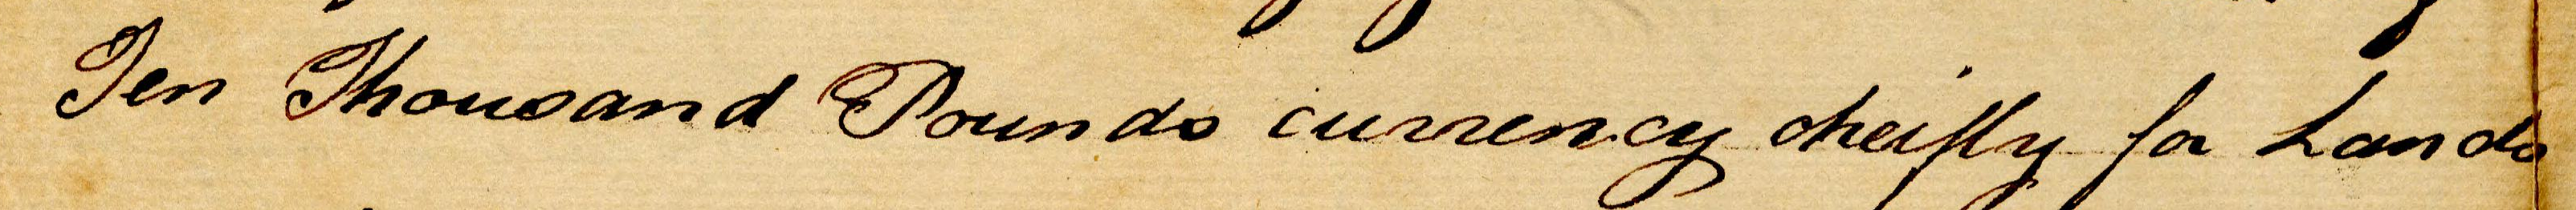Ten Thousand Pounds currency cheifly for Lands
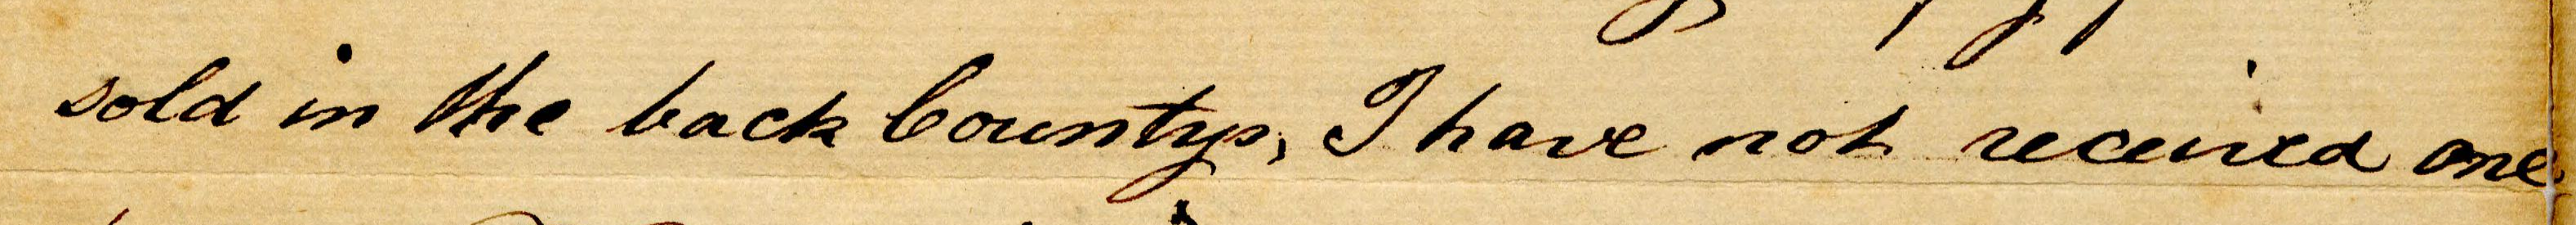sold in the back Countys, I have not received one
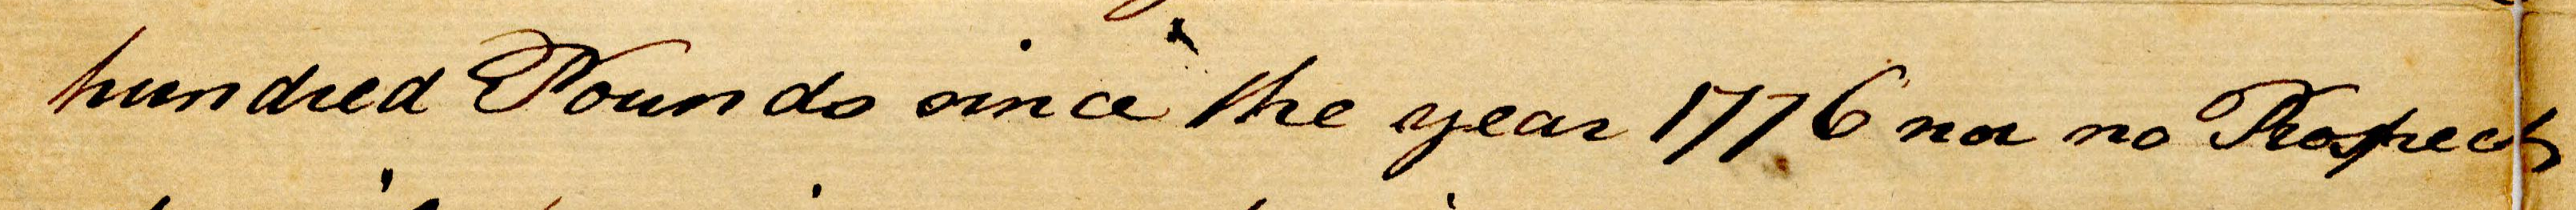hundred Pounds since the year 1776 nor no Prospect
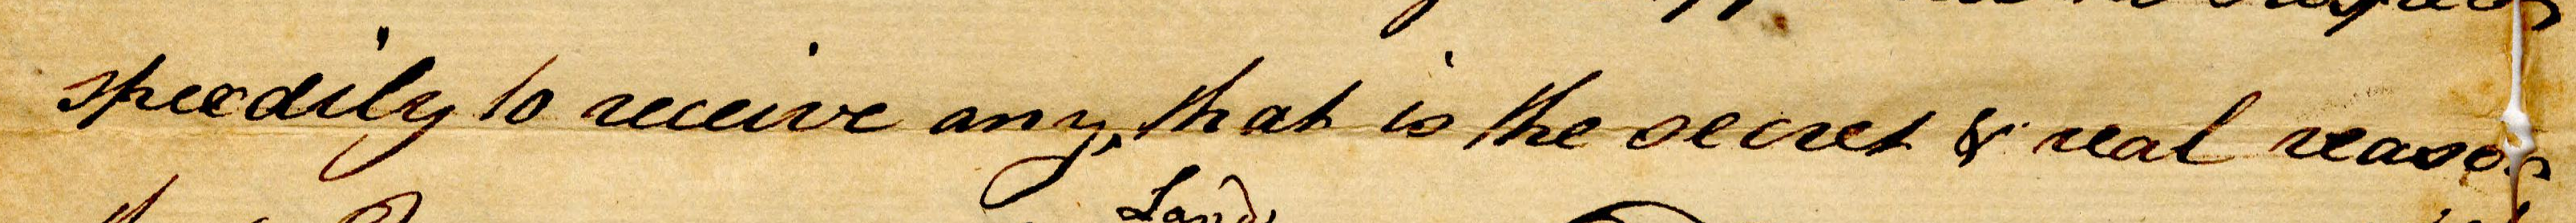speedily to receive any, that is the secret & real reason
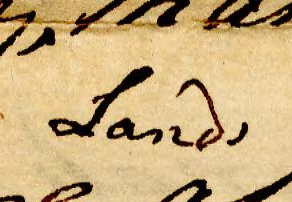Lands
